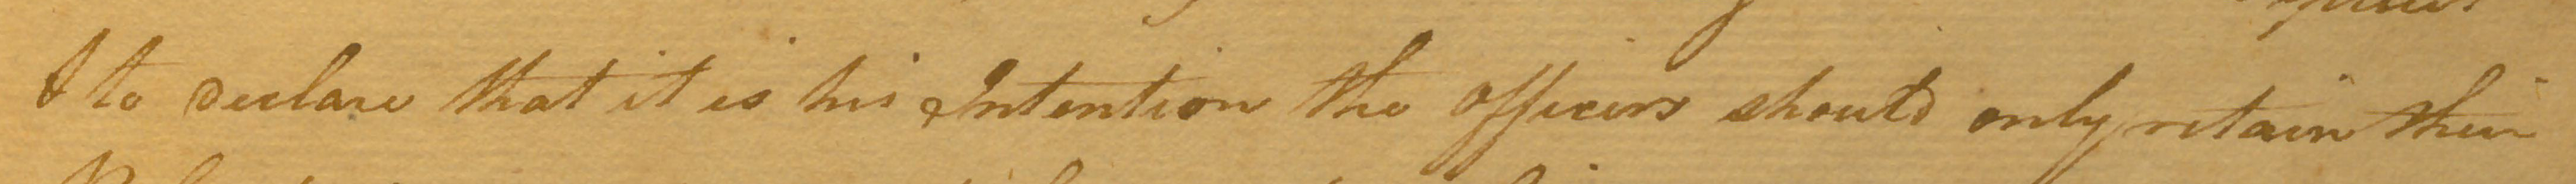& to declare that it is his Intention the officers should only retain their
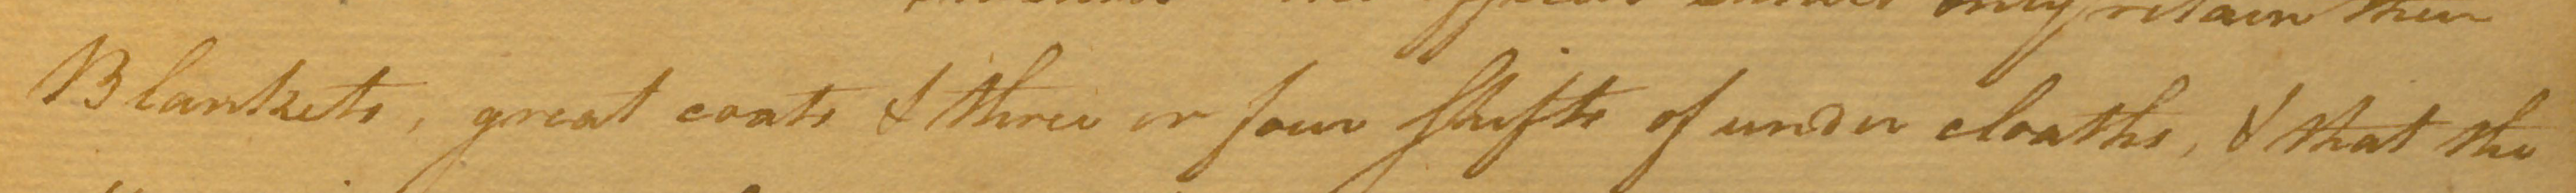Blankets, great coats & three or four shifts of under cloaths, & that the
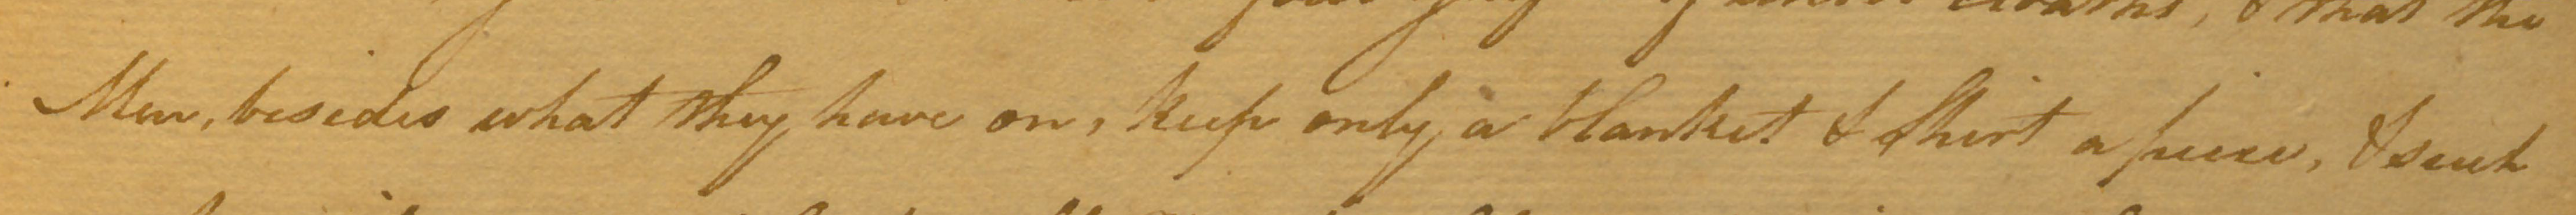Men, besides what they have on, keep only a blanket & Shirt a piece, & such
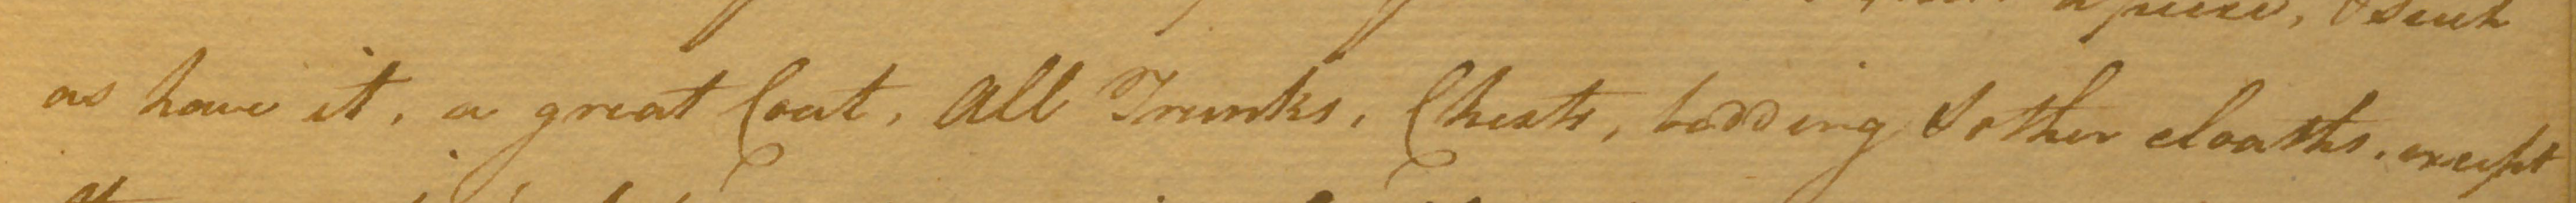as have it, a great Coat, all Trunks, Chests, bedding & oher cloaths, except
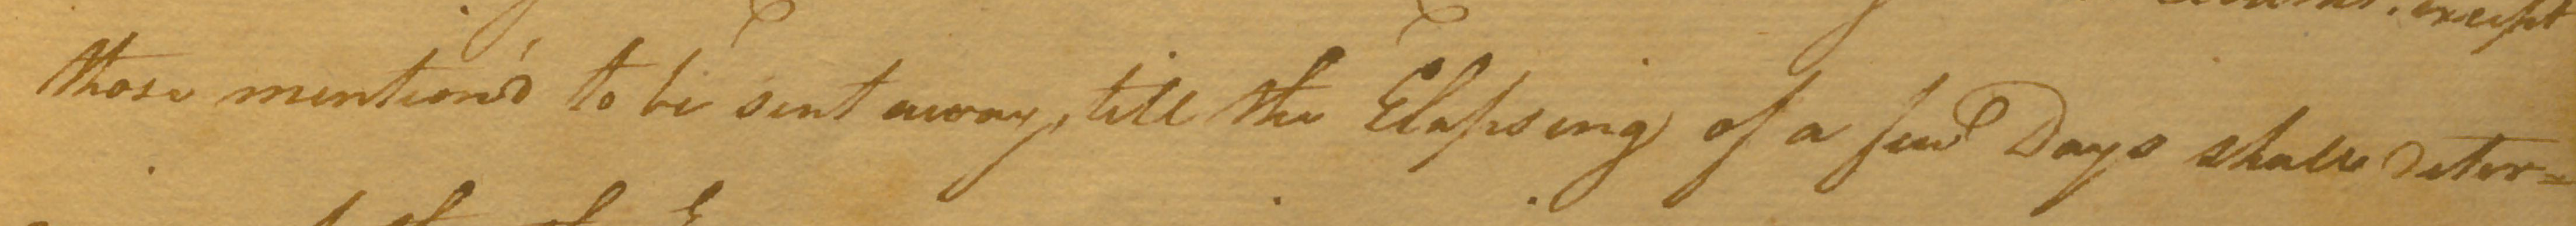those mention'd to be sent away, till the Elapsing of a few Days shall deter-
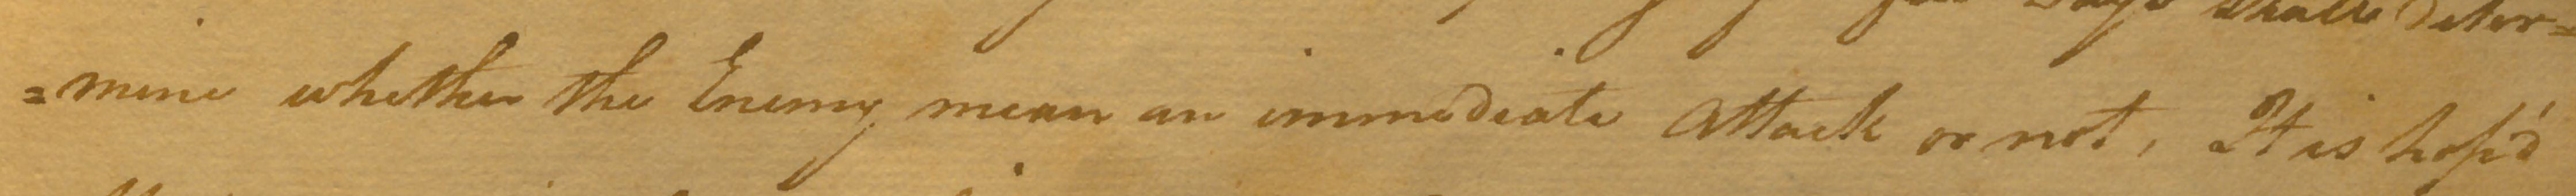-mine whether the Enemy mean an immediate Attack or not, It is hop'd
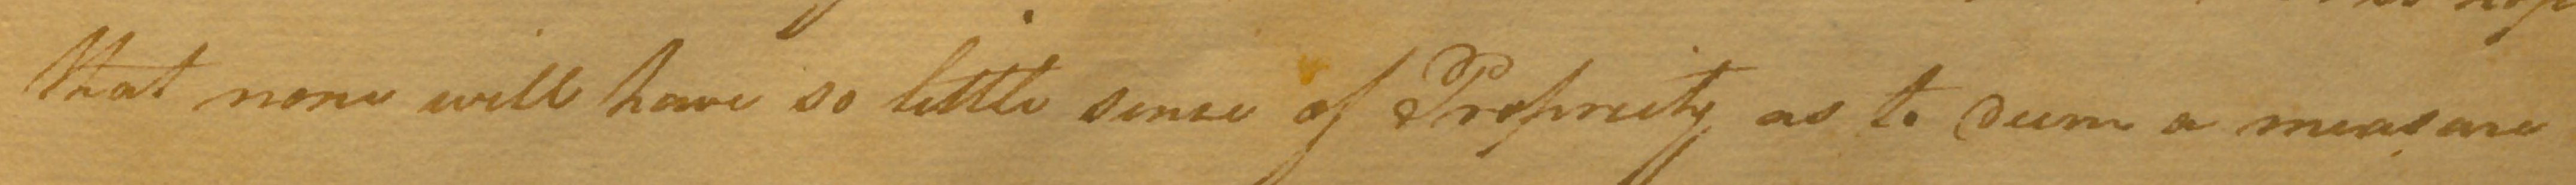that none will have so little sense of Propriety as to deem a measure
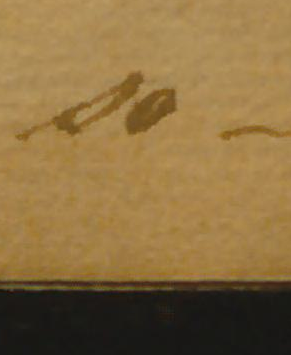so-
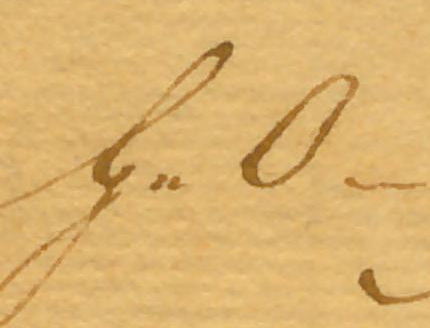G.O-
